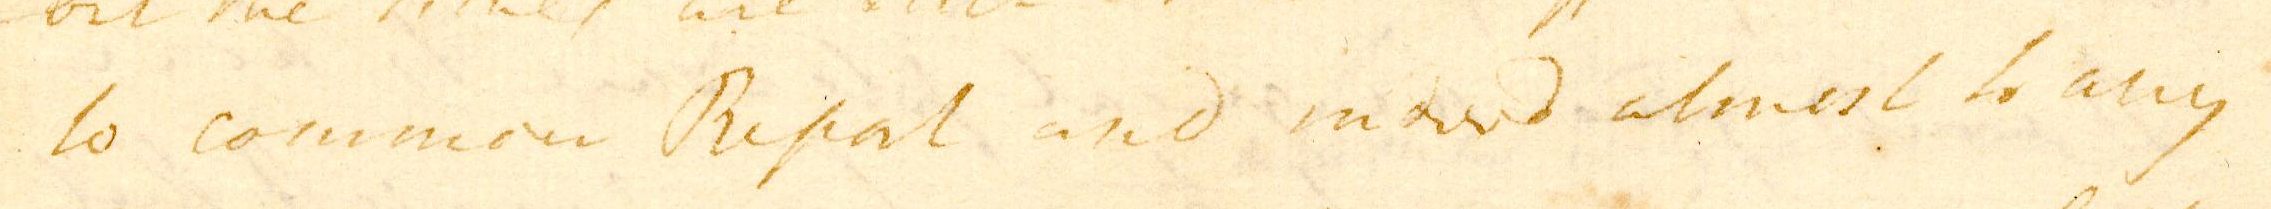to common Report and indeed almost to any
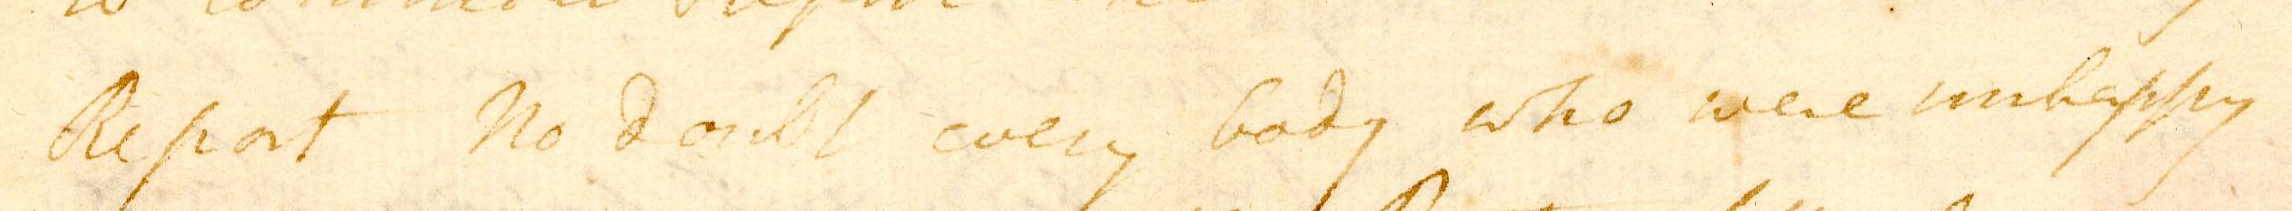Report No doubt every body who were unhappy
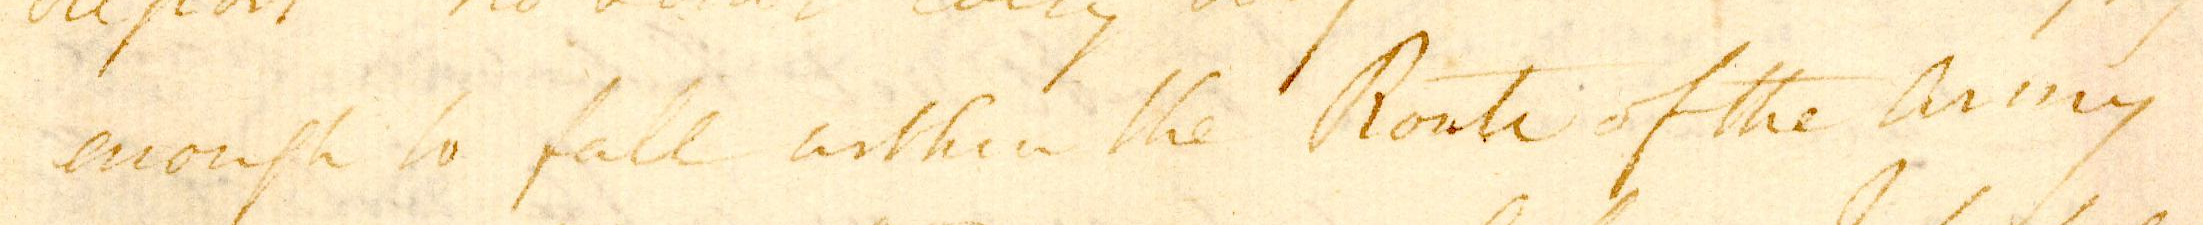enough to fall within the Route of the Army
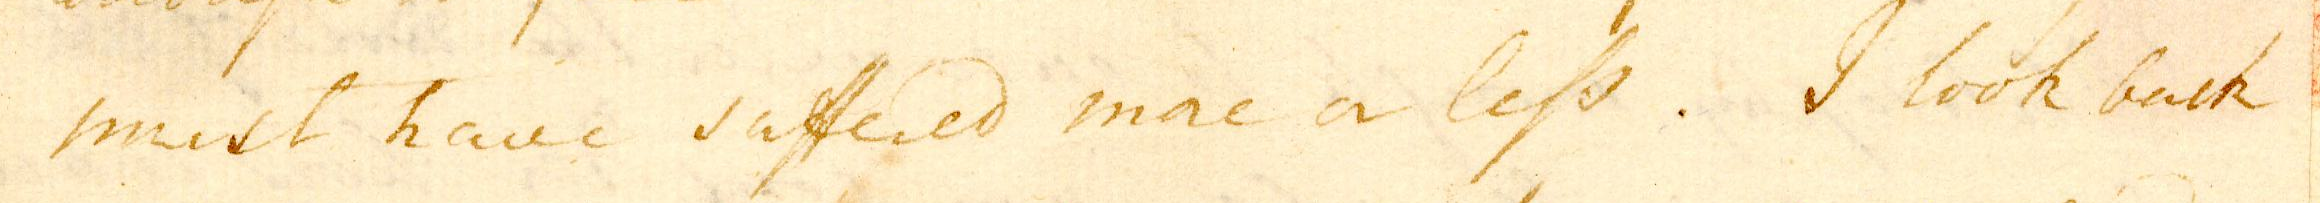must have suffered more or less. I look back
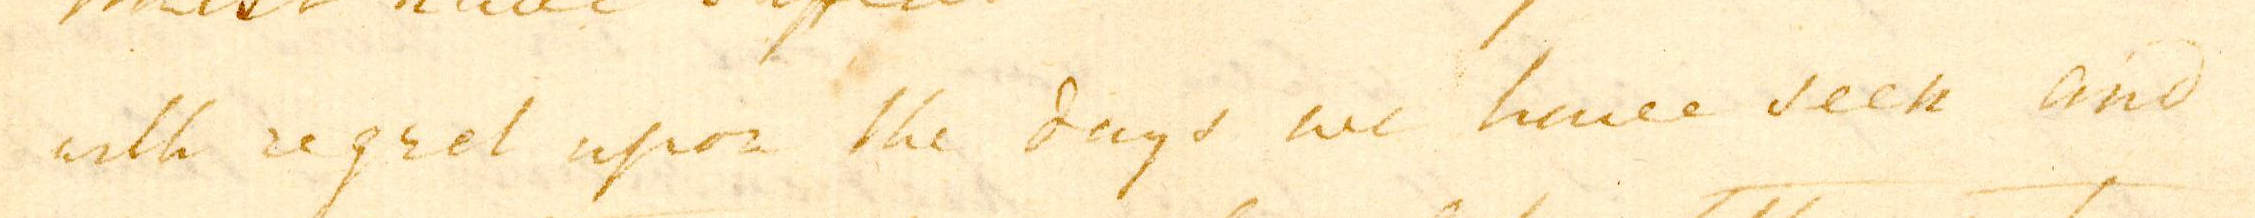with regret upon the days we have seen and
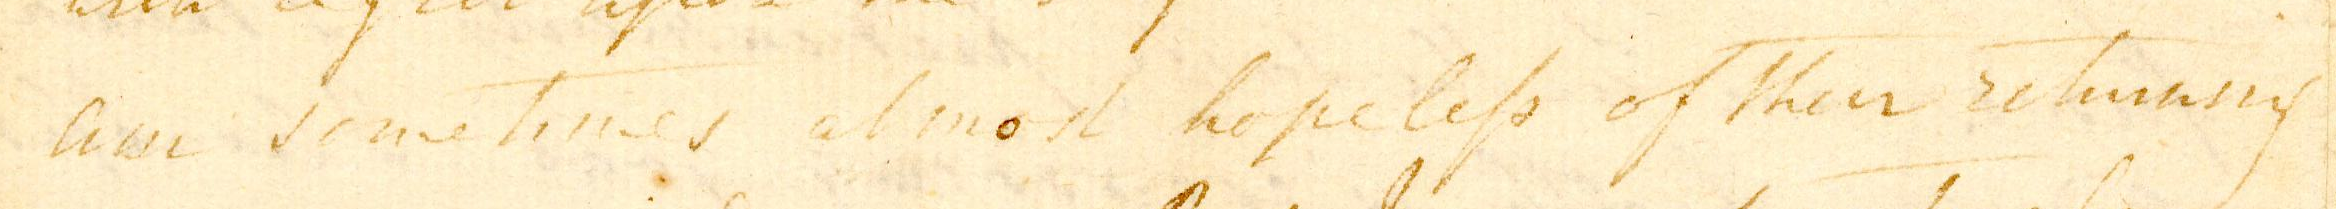Am sometimes almost hopeless of their returning
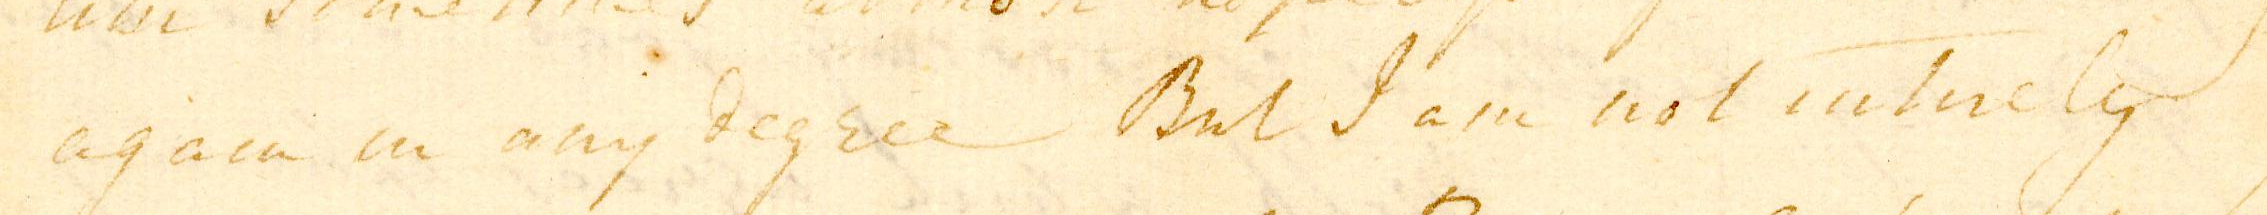again in any degree But I am not entirely
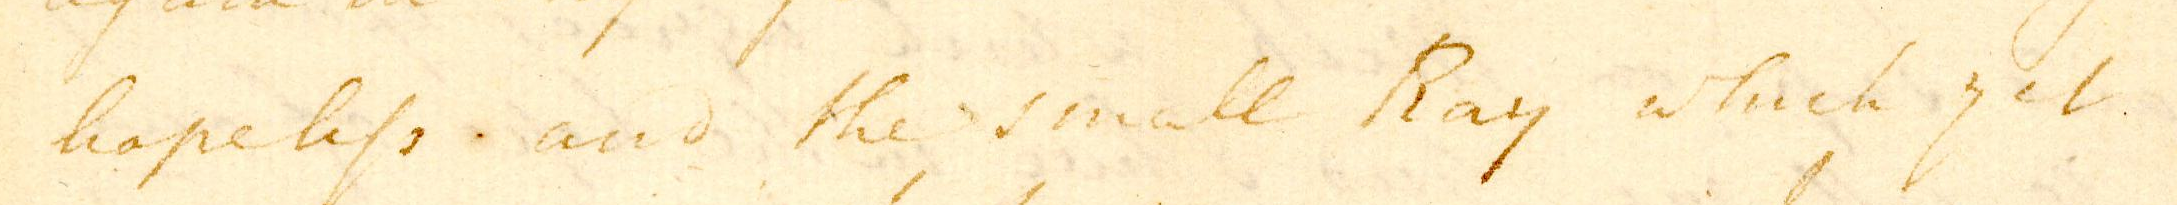hopeless and the small Ray which yet
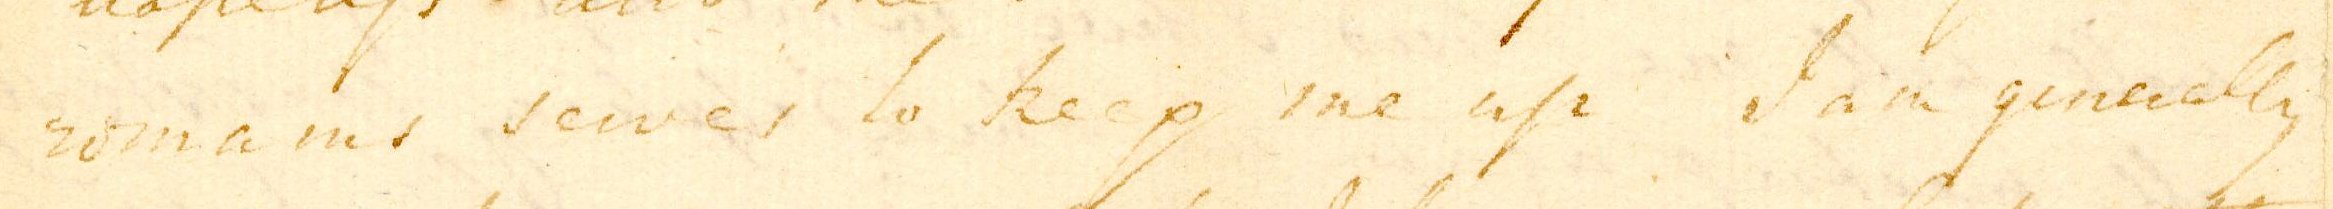remains serves to keep me up I am generally
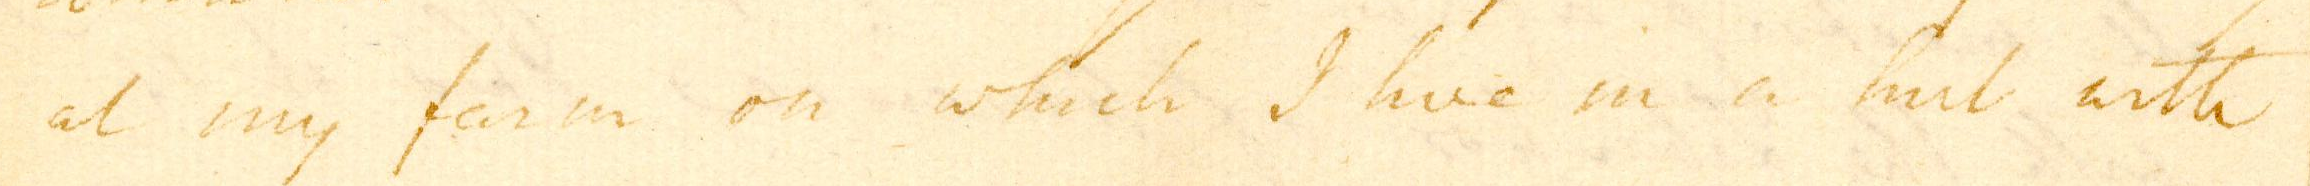at my farm on which I live in a hut with
